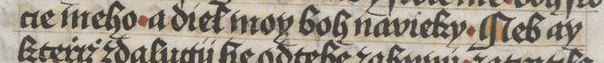cie meho.a diel moy boh navieky.Neb ay
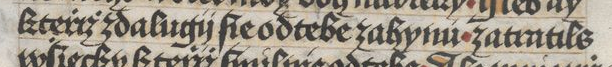kteṙiż zdalugij ſie odtebe zahynu.zatratils
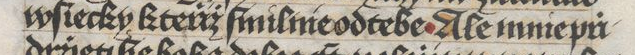wẛiecky kteṙiż ſmilníe odtebe.Ale mnie pṙi¬
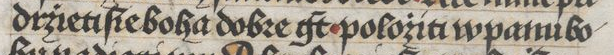drżieti ſie boha dobre ḡt.polożiti w panu bo¬
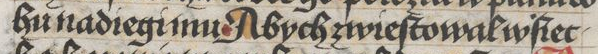hu nadiegi mu.Abych zwieſtowal wẛiec¬
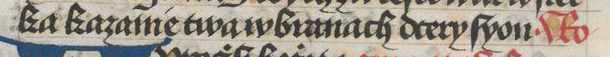ka kazanie twa wbranach dcery ſyon.Ro
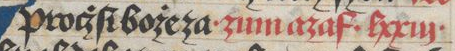Procżſi boże za.zum azaf.lxxiij.
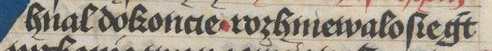hnal dokoncie.rozhniewalo ſie ḡt
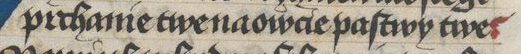prchanie twe na owcie paſtwy twe?
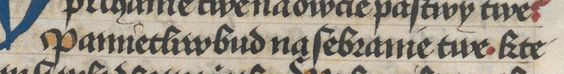Pamietliwbud naſebranie twe.kte¬
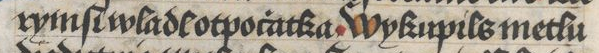rym ſi wladl otpoċatka.Wykupils metlu
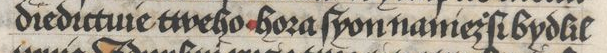diedictuie tweho.hora ſyon nanieżſi bydlil
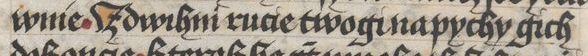wnie.Zdwihni rucie twogi na pychy gich
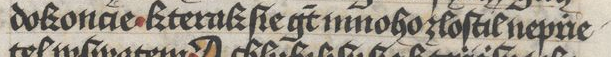dokoncie.kterak ſie ḡt mnoho zloſtil nepṙie¬
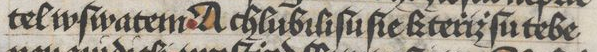tel wſwatem.A chlubiliſu ſie kteṙiż ſu tebe
